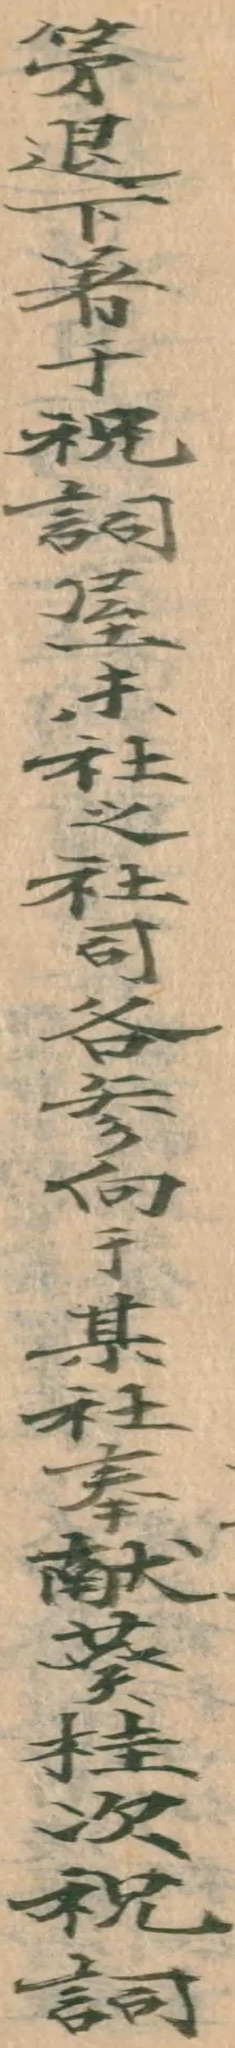第退下着于祝詞屋末社之社司各参向于某社奉献葵桂次祝詞
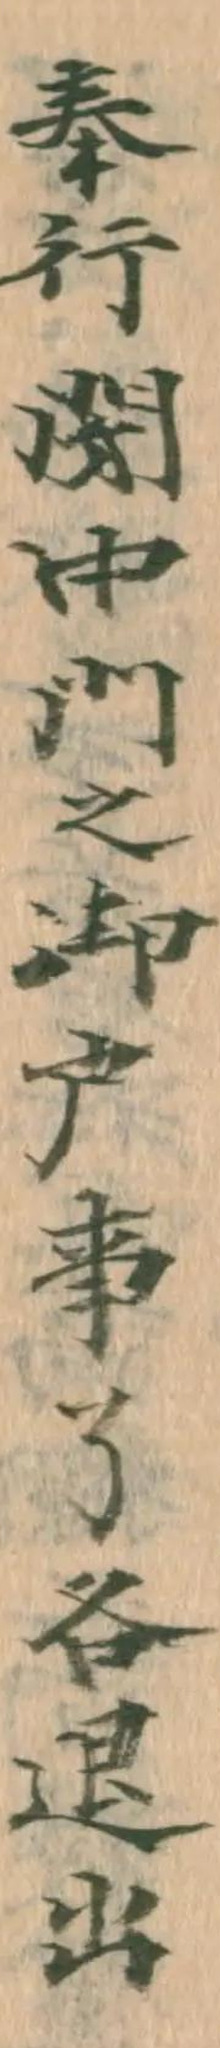奉行閉中門之御戸事了各退出
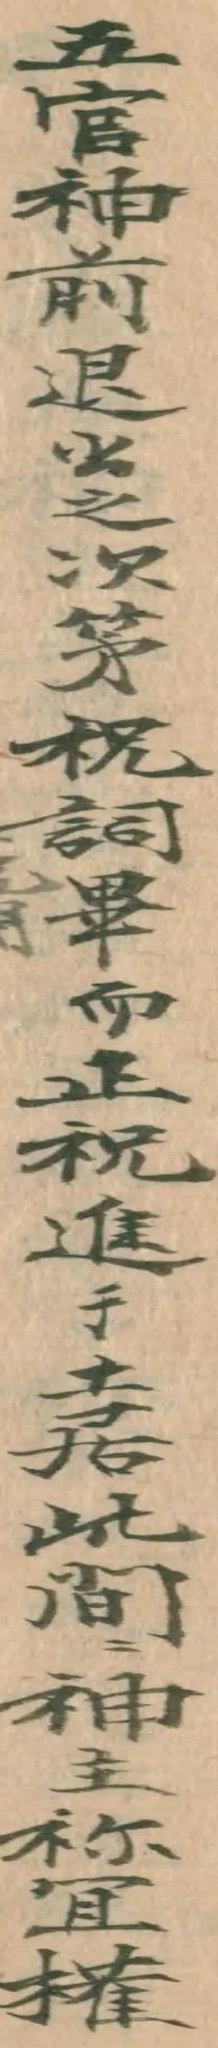五官神前退出之次第祝詞畢而正祝進于土居此間ニ神主禰宜権
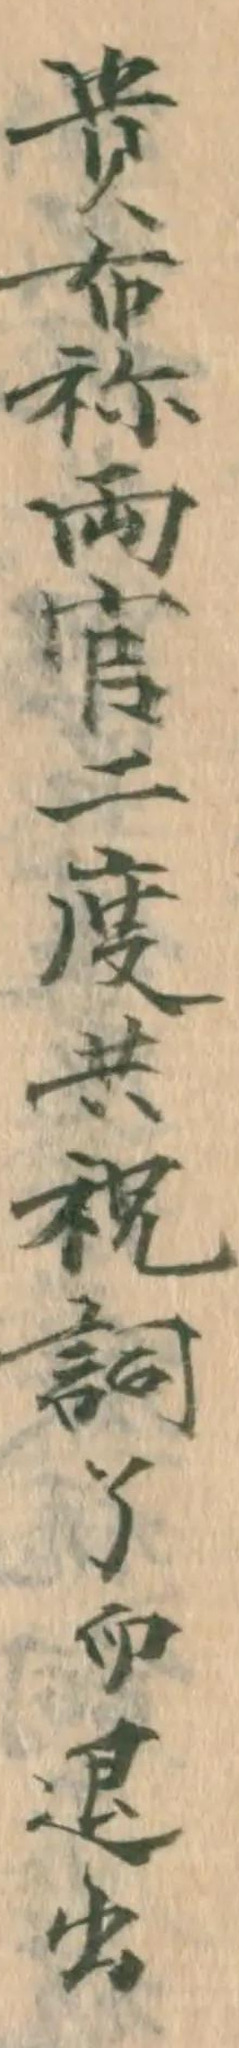貴布禰両官二度共祝詞了而退出
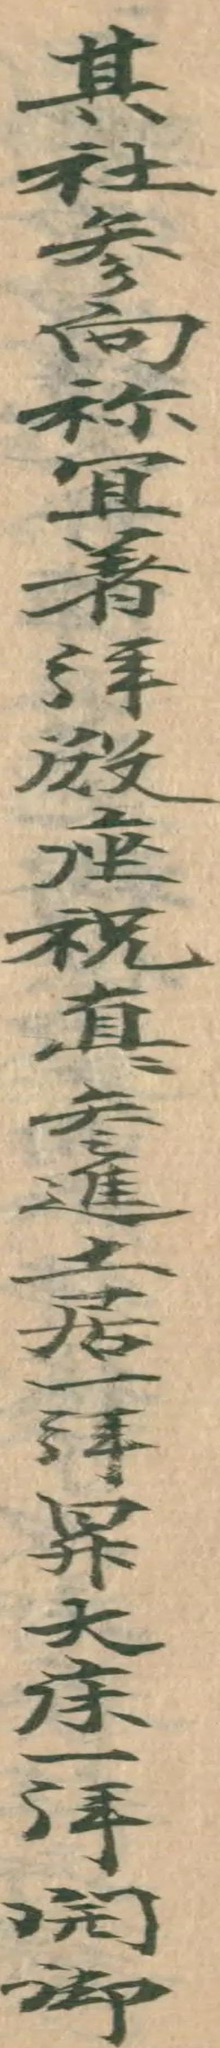其社参向禰宜着拝殿座祝直ニ参進土居一拝昇大床一拝開御
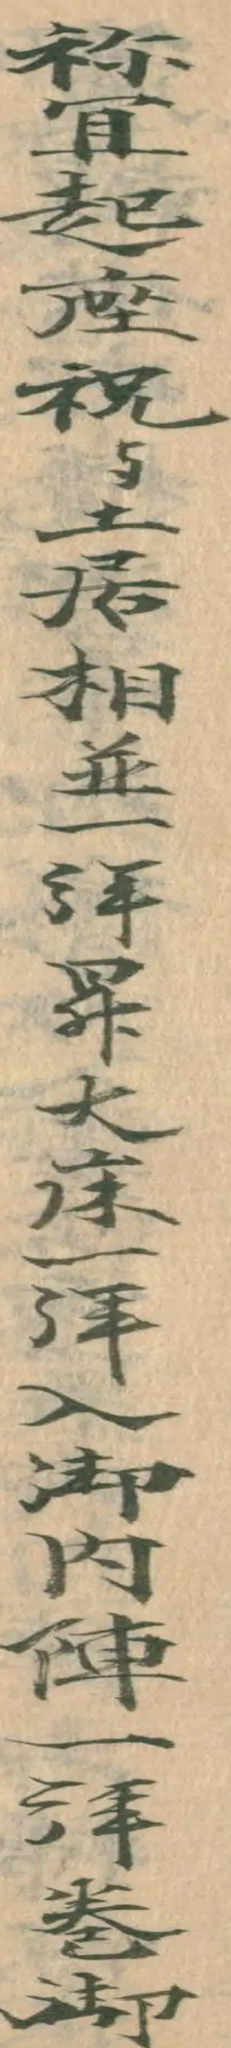禰宜起座祝与土居相並一拝昇大床一拝入御内陣一拝巻御

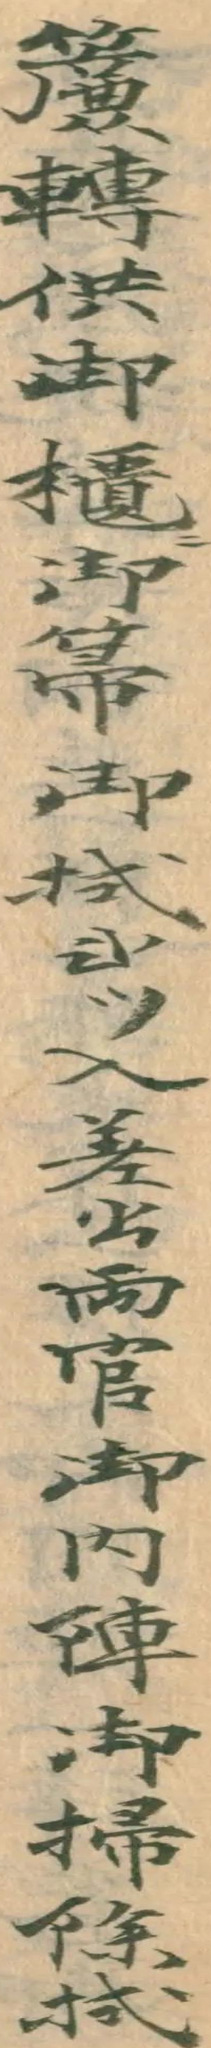簾転供御櫃ニ御箒御拭弐ツ入差出両官御内陣御掃除拭
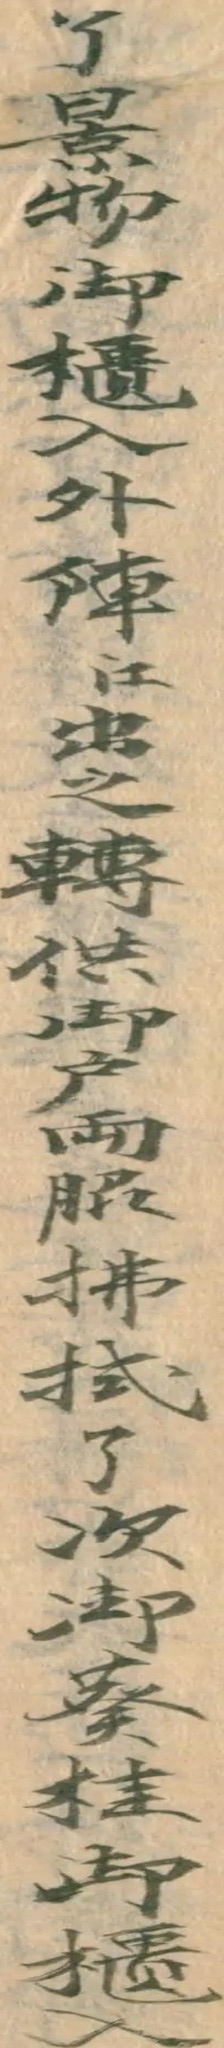了景物御櫃入外陣江出之転供御戸両脇払拭了次御葵桂御櫃入
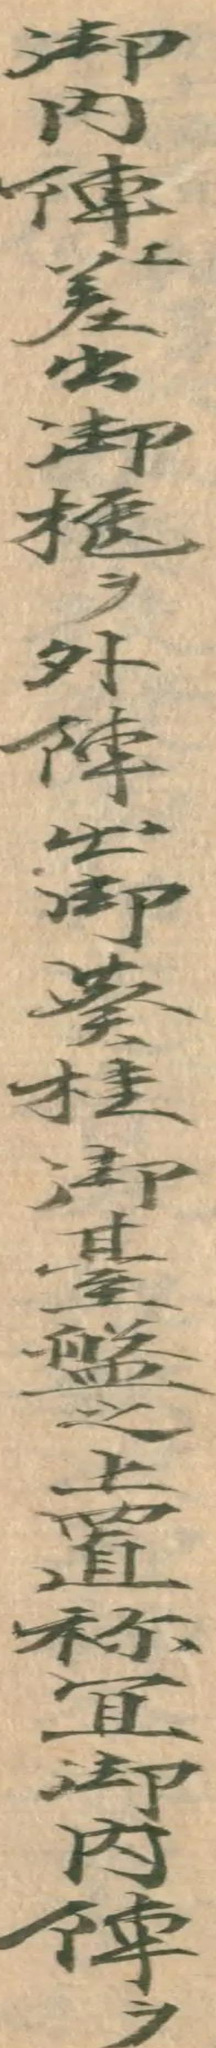御内陣江差出御櫃ヲ外陣出御葵桂御台盤之上置禰宜御内陣ヲ
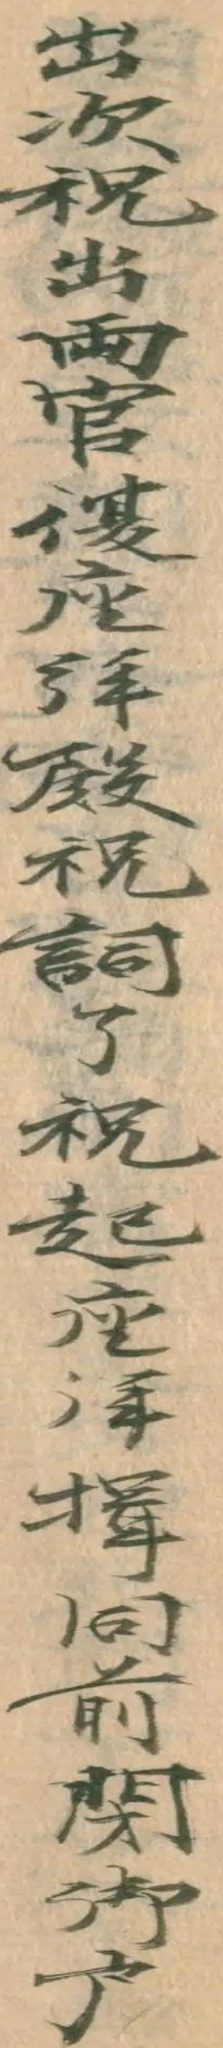出次祝出両官復座拝殿祝詞了祝起座拝揖同前閉御戸
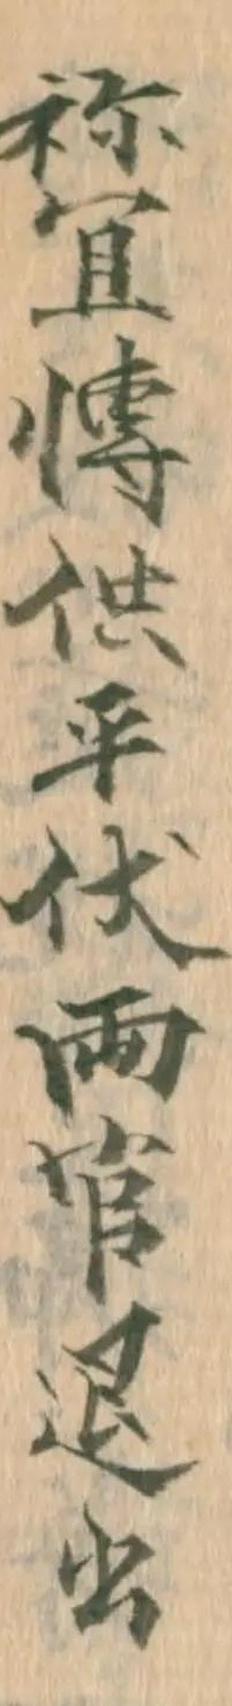禰宜転供平伏両官退出
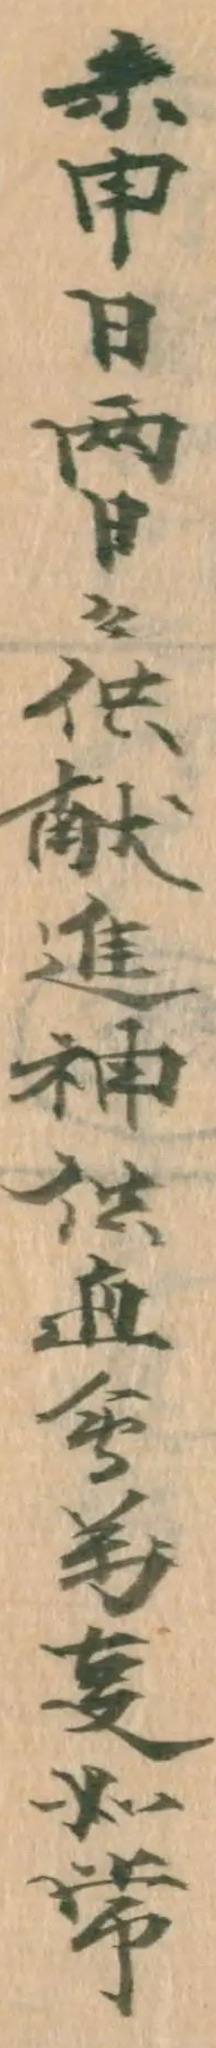未申日両日々供献進神供直会万事如常
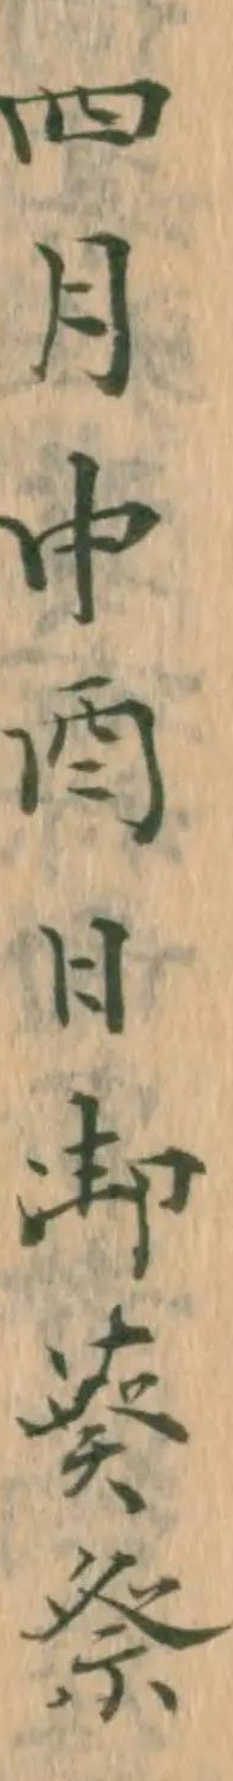四月中酉日御葵祭
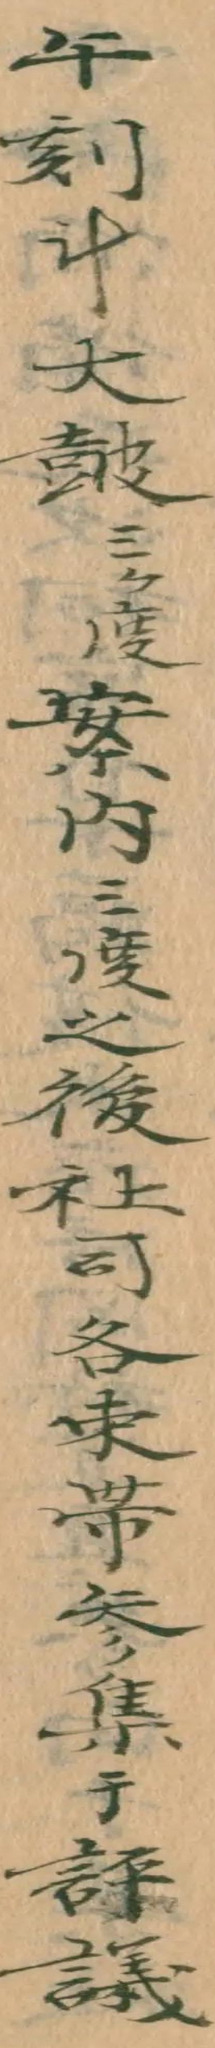午刻計大鼓三ケ度案内三度之後社司各束帯参集于評議
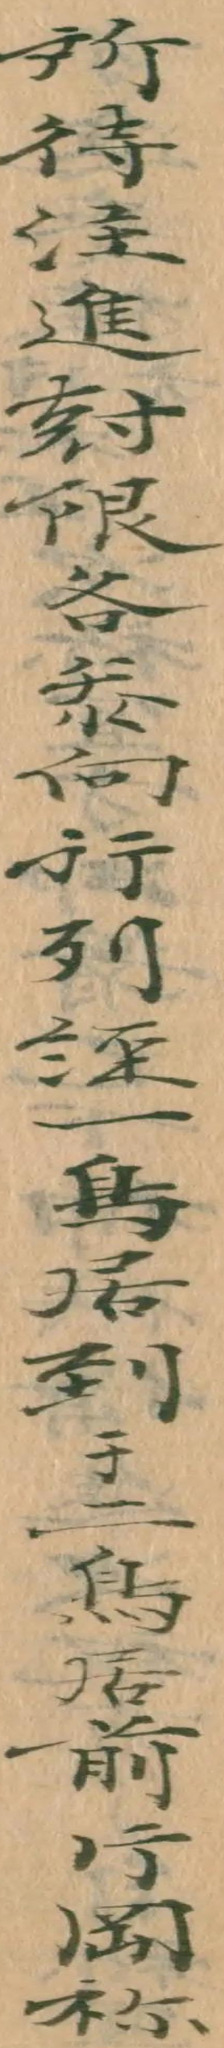所待注進封限各参向行列経一鳥居到于二鳥居前片岡禰
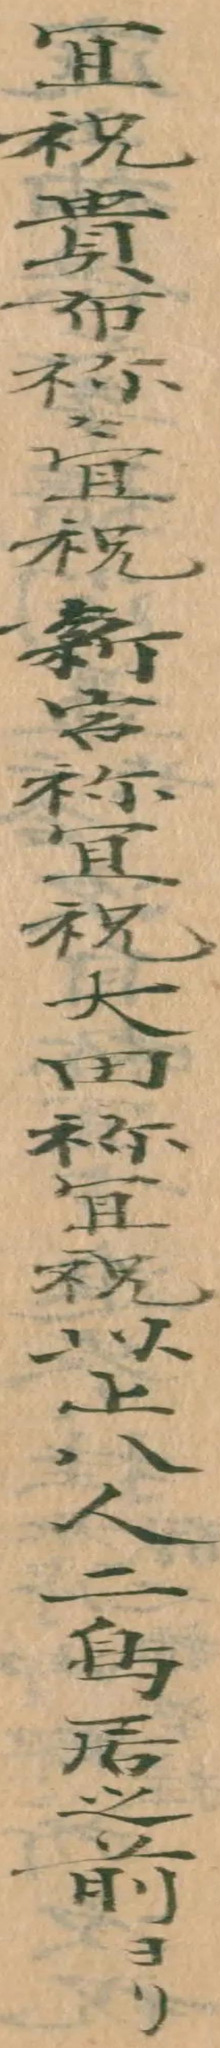宜祝貴布禰々宜祝新宮禰宜祝大田禰宜祝以上八人二鳥居之前ヨリ
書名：賀茂社記録. 第5冊
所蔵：国立国会図書館 National Diet Library, JAPAN
